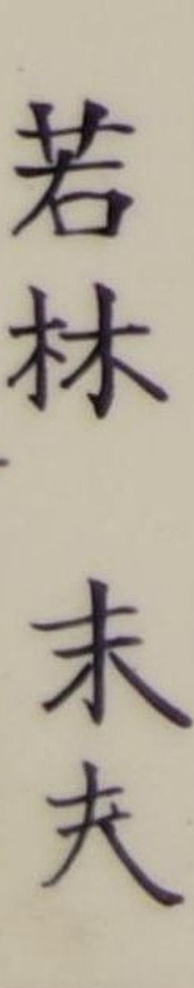若林末夫
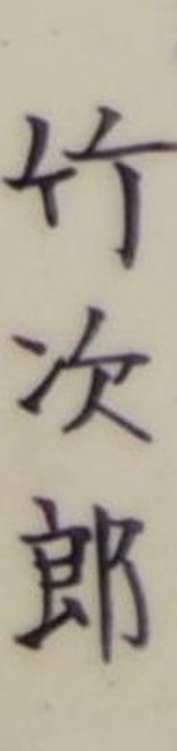竹次郎
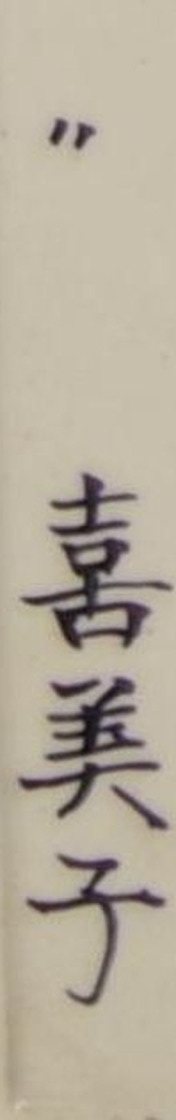喜美子
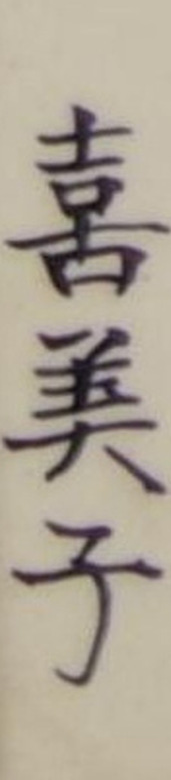喜美子

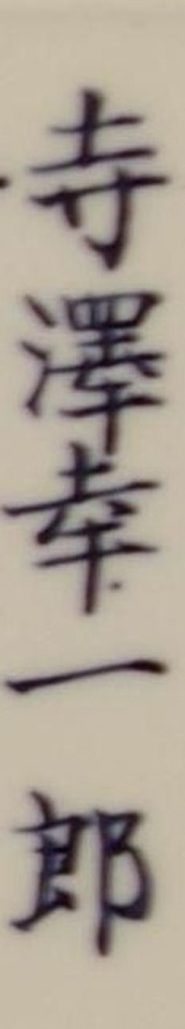寺澤幸一郎
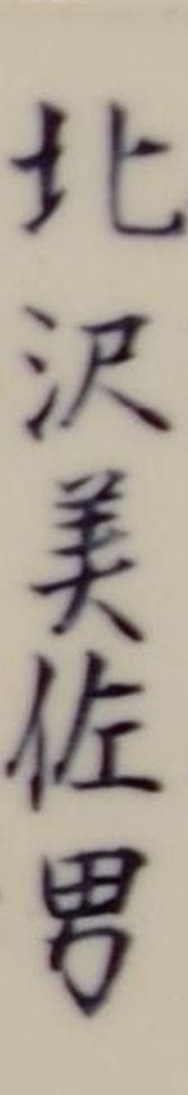北沢美佐男
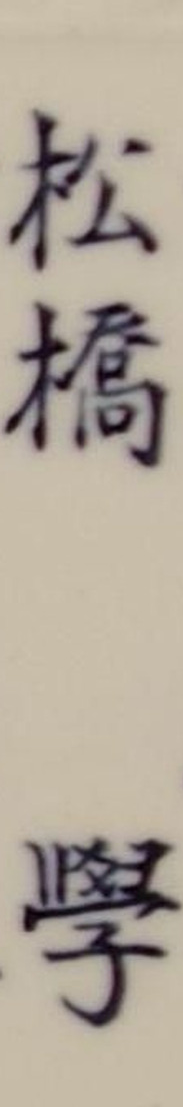松橋学
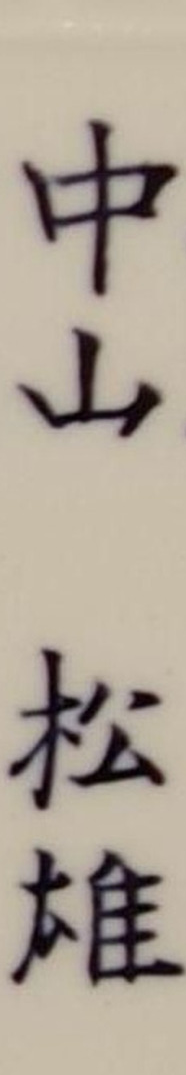中山松雄
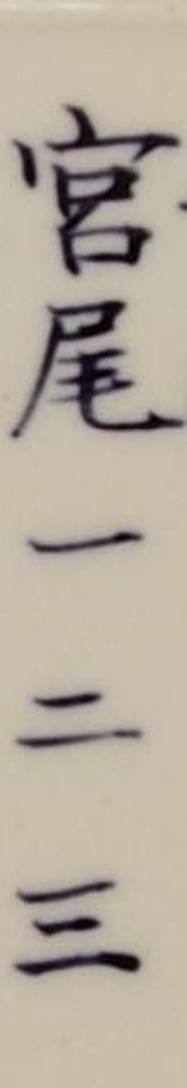宮尾一二三
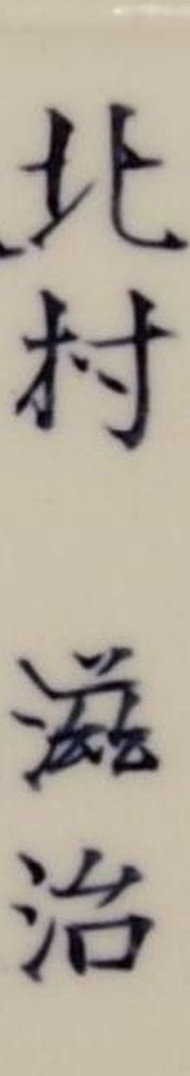北村滋治
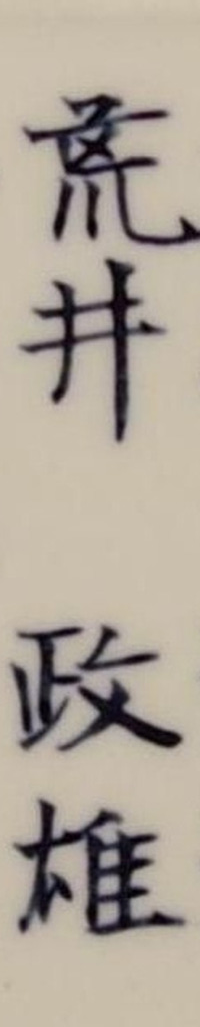荒井政雄
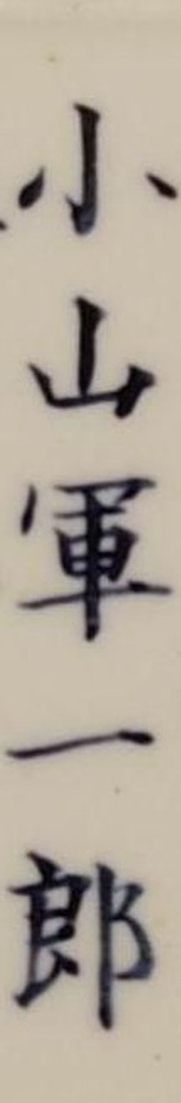小山軍一郎
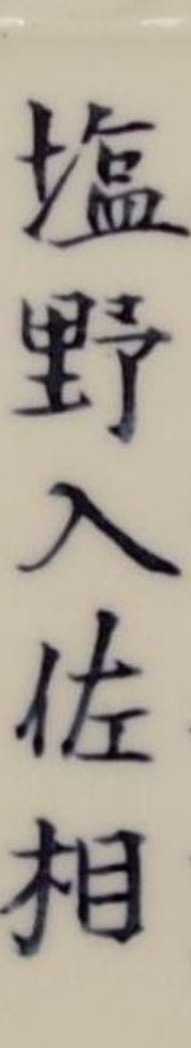塩野入佐桐
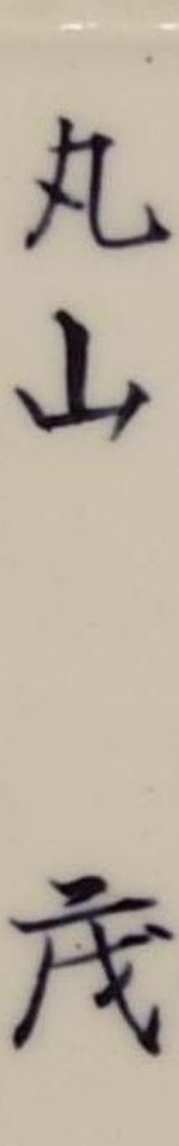丸山茂
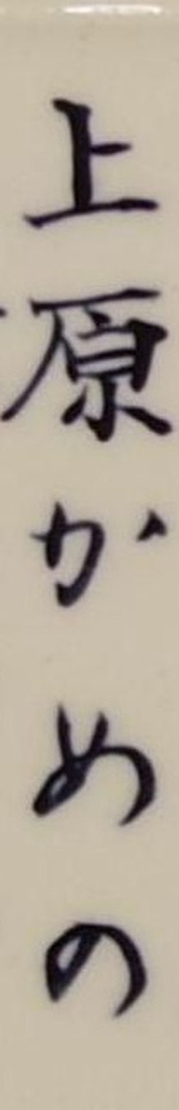上原かめの
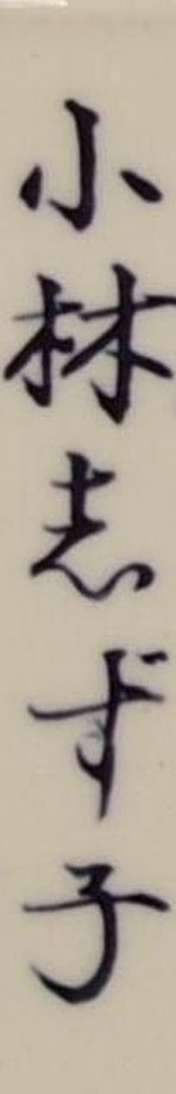小林しず子
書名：E~L
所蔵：高野山金剛峯寺
